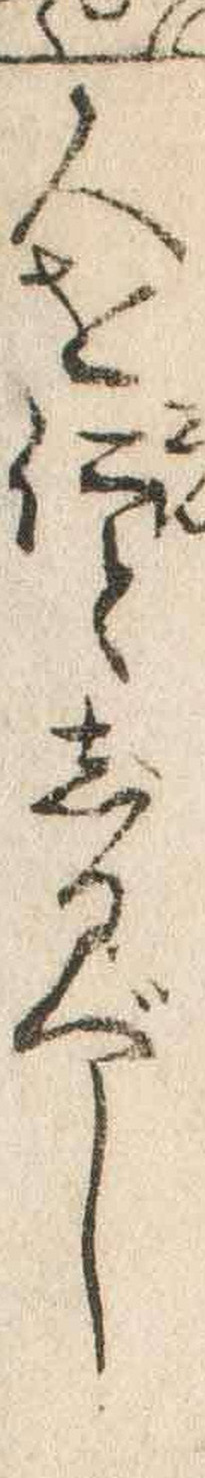人を仁としるべし
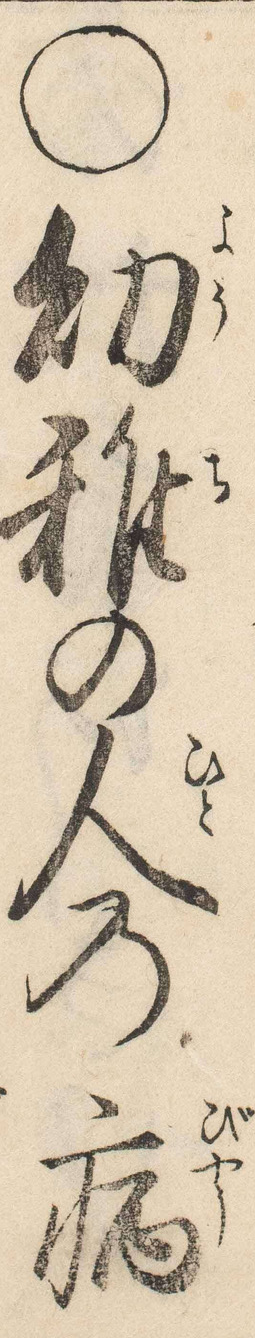〇幼稚の人の病
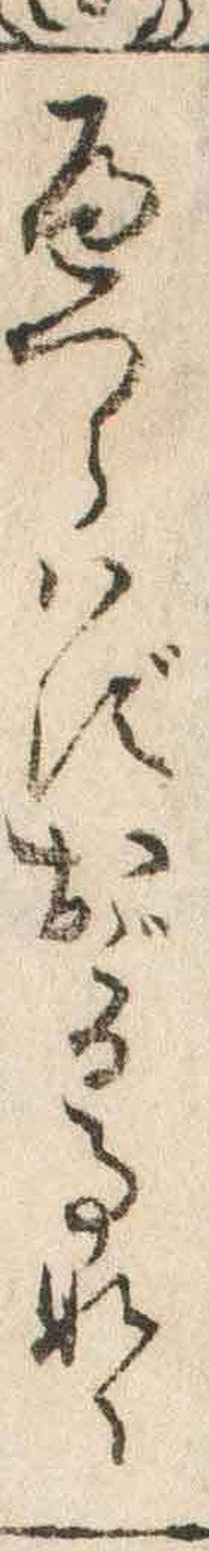へつらはずおごる事なく
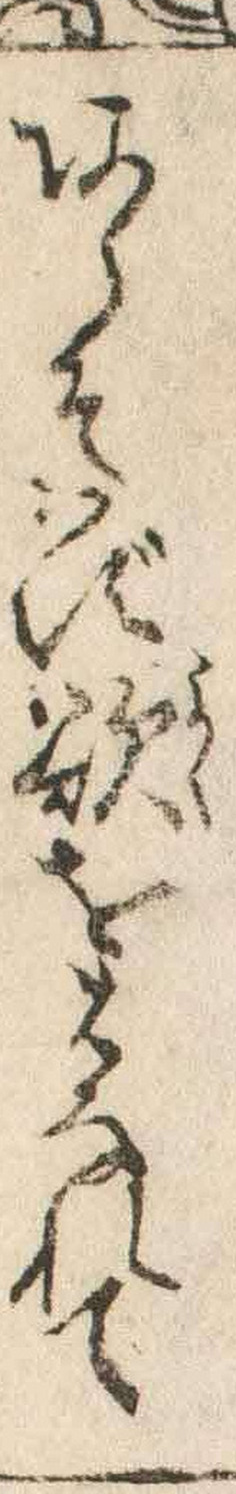義あらそはず欲をはなれて
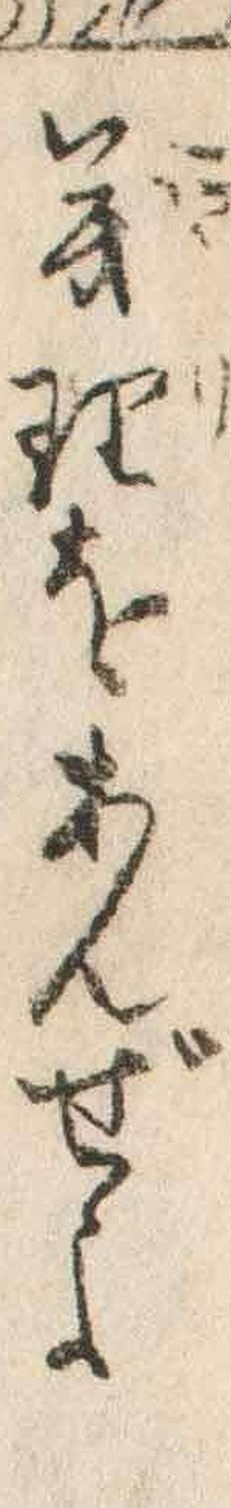義理をあんぜよ
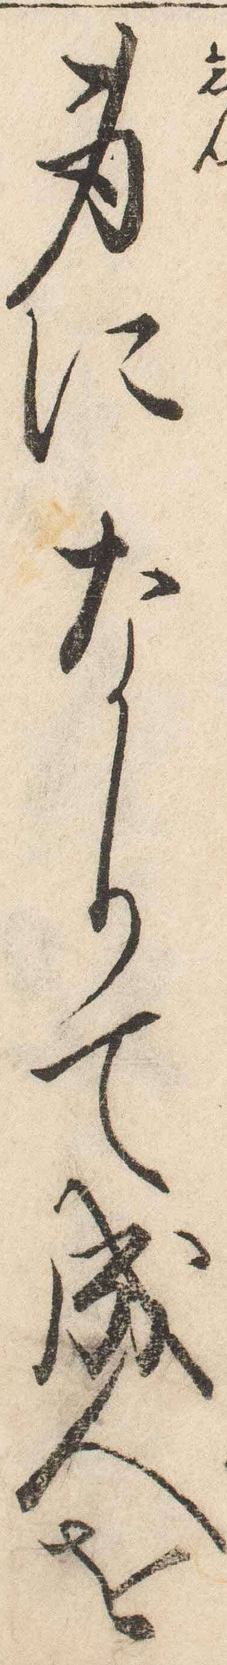身になりて成人を
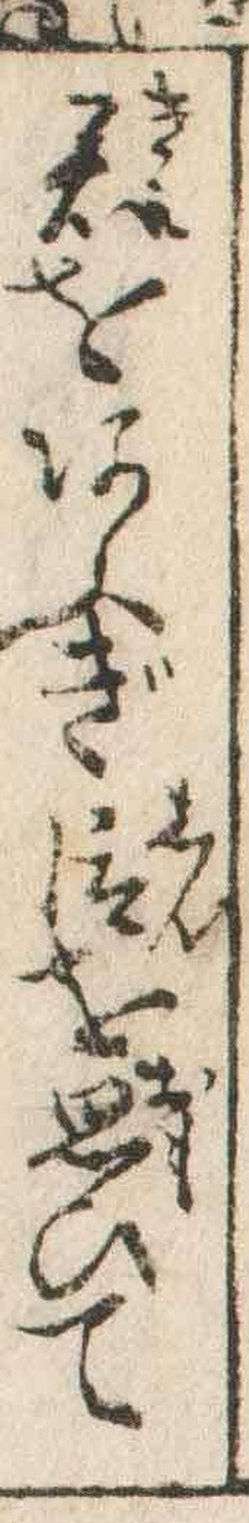君をあふぎ臣を思ひて
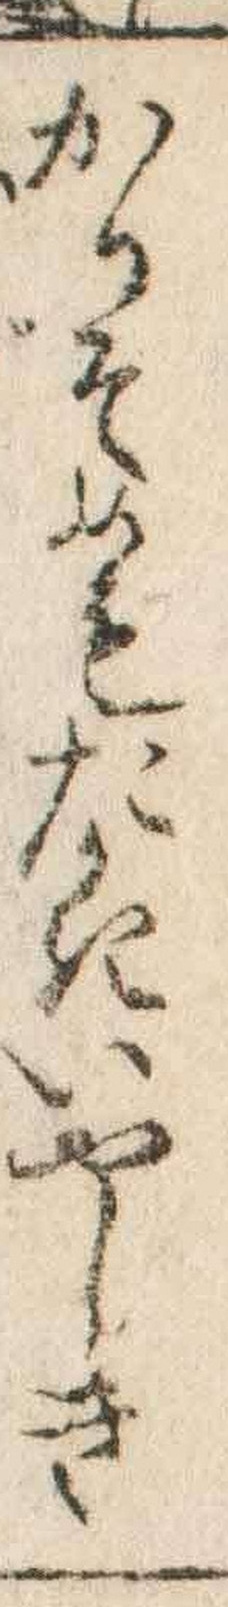礼かりそめもたかきいやしき
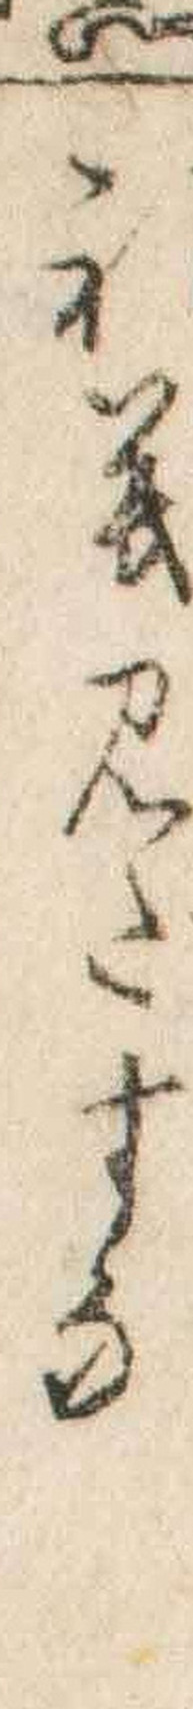礼義みだすな
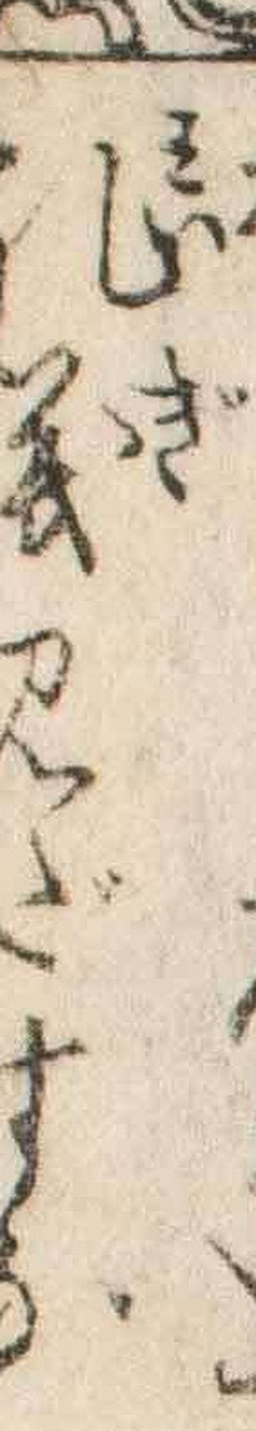礼義みだすな
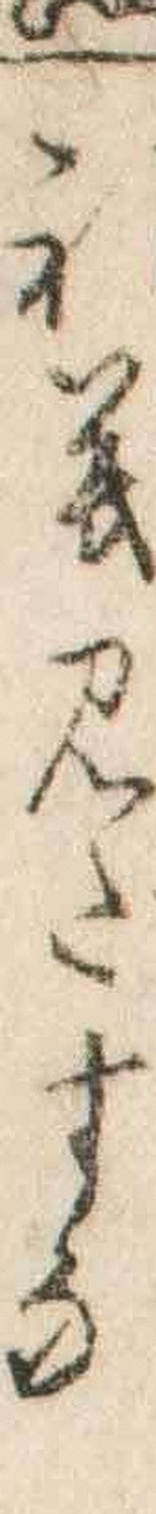礼義みだすな
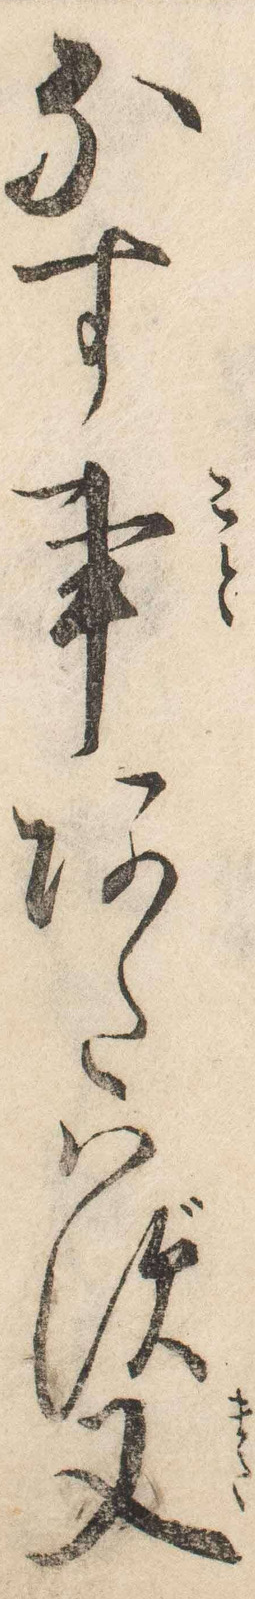なす事あたはず又
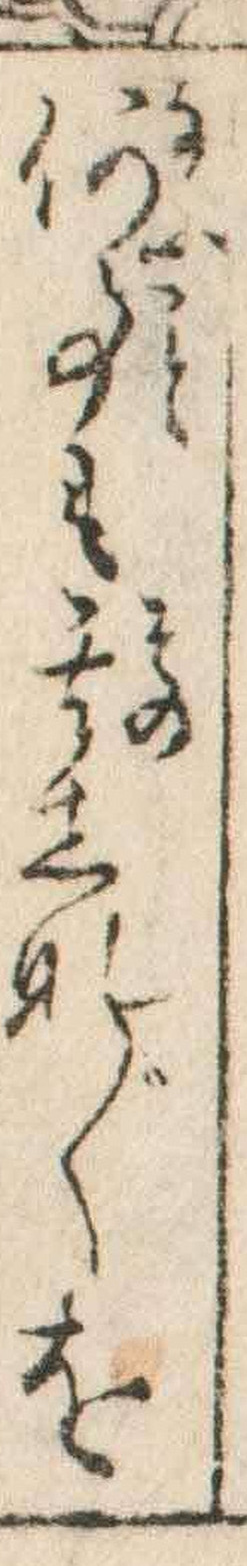何事も其しな〴〵を
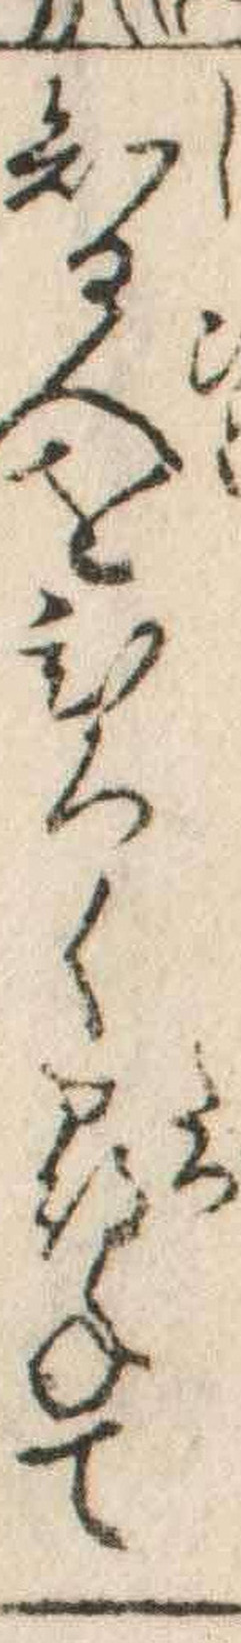智知る人をひろく尋ねて
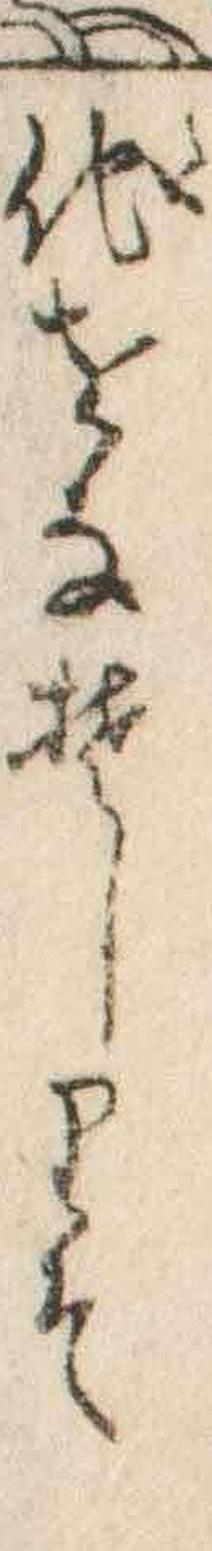他をなそしりそ
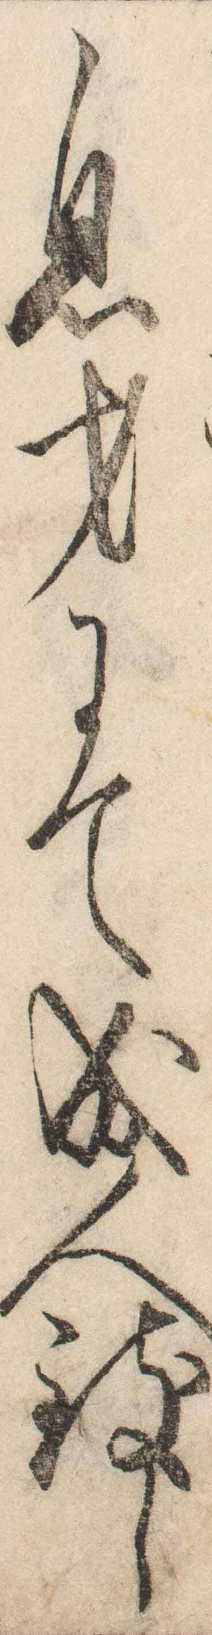息才にて成人致し
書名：撫育草
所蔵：東京学芸大学附属図書館 国文学研究資料館
